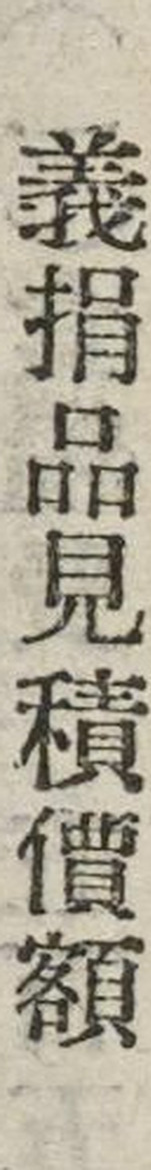義捐品見積価格
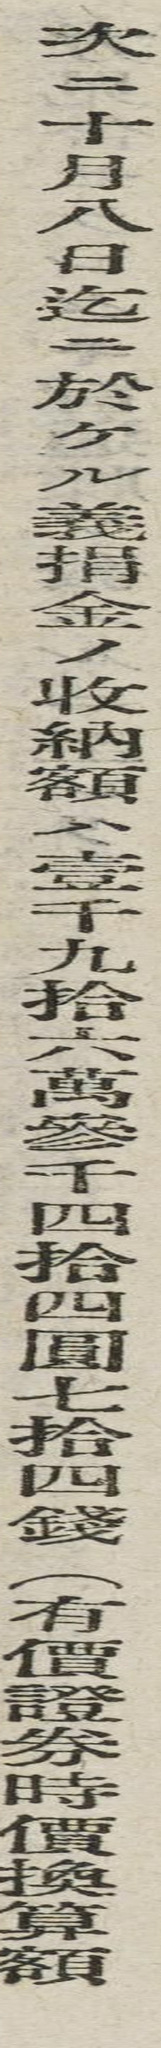次ニ十月八日迄ニ於ケル義捐金ノ収納額ハ壹千九拾六万参千四拾四円七拾四銭（有価証券時価換算額
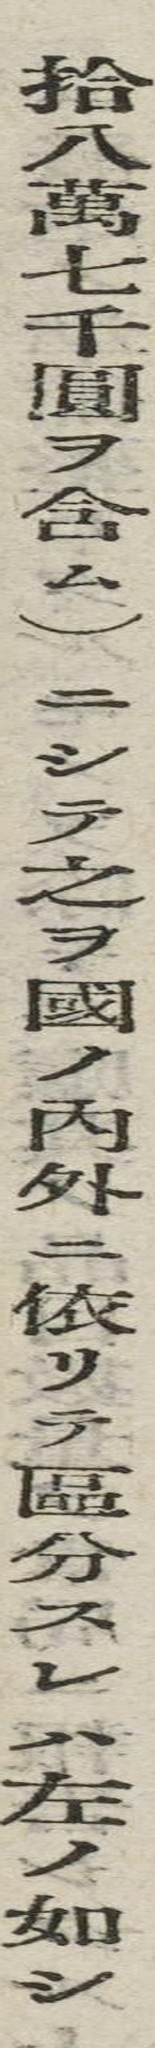拾八万七千円ヲ含ム）ニシテ之ヲ内外ニ依リテ区分スレハ左ノ如シ
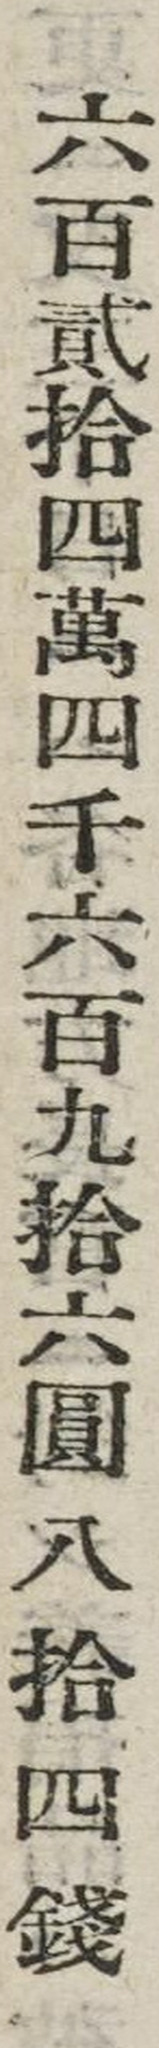内地六百弐拾四万四千六百九拾六円八拾四銭
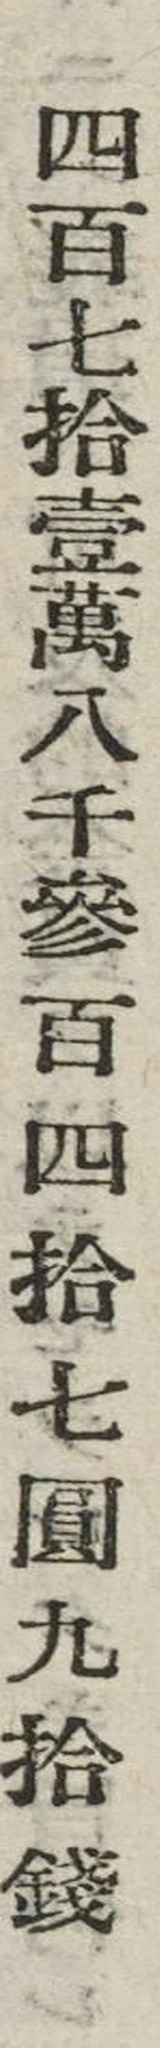外国四百七拾壹万八千参百四拾七円九拾銭
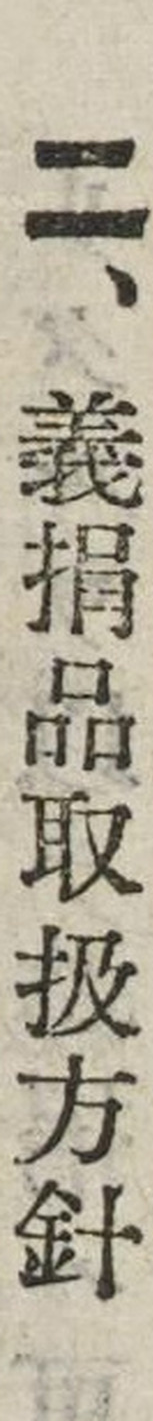ニ、義捐品取扱方針
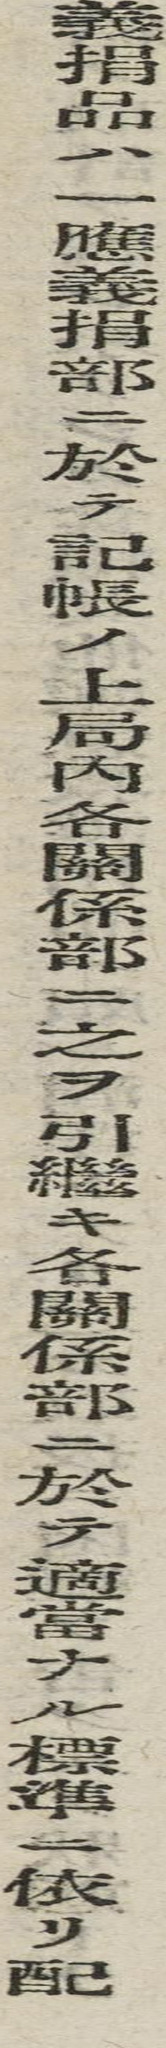義捐品ハ一応義捐部ニ於テ記帳ノ上局内各関係部ニ之ヲ引継キ各関係部ニ於テ適当ナル標準ニ依リ配

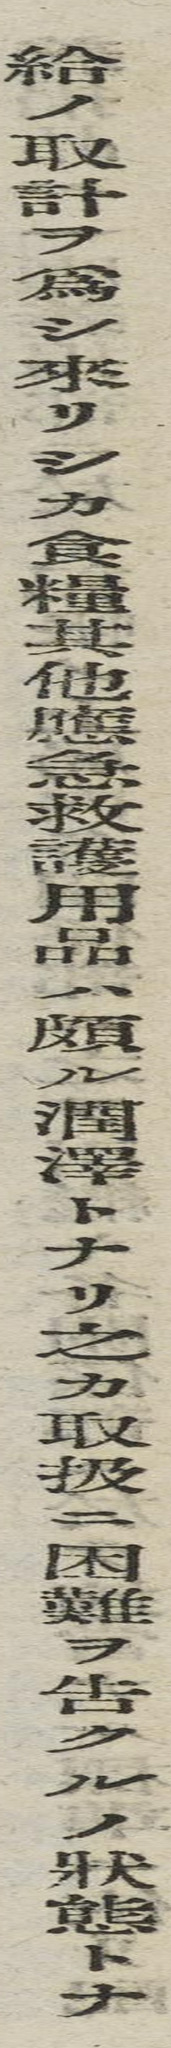給ノ取計ヲ為シ来リシカ食糧其他応急救護用品ハ頗ル潤沢トナリ之カ取扱ニ困難ヲ告クルノ状態トナ
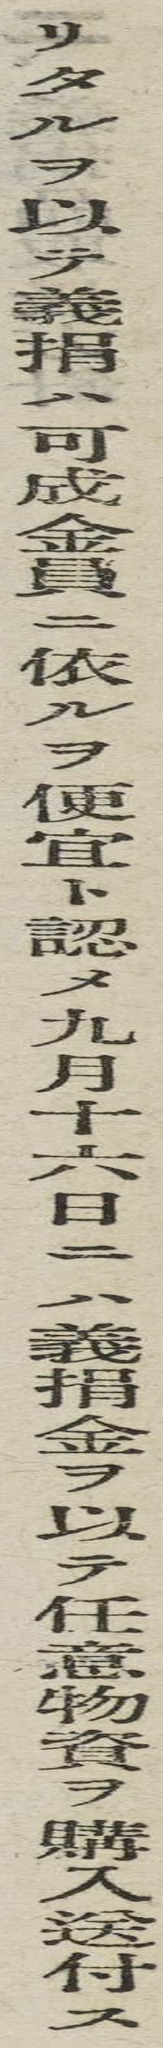リタルヲ以テ義捐ハ可成金員ニ依ルヲ便宜ト認メ九月十六日ニハ義捐金ヲ以テ任意物資ヲ購入送付ス
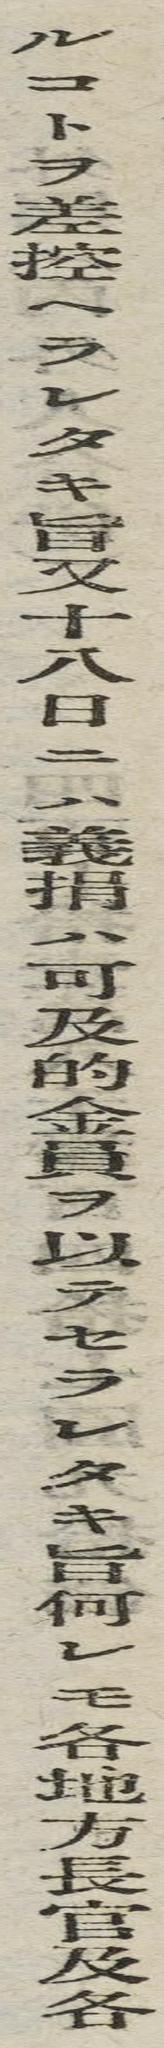ルコトヲ差控ヘラレタキ旨又十八日ニハ義捐ハ可及的金員ヲ以テセラレタキ旨何レモ各地方長官及各
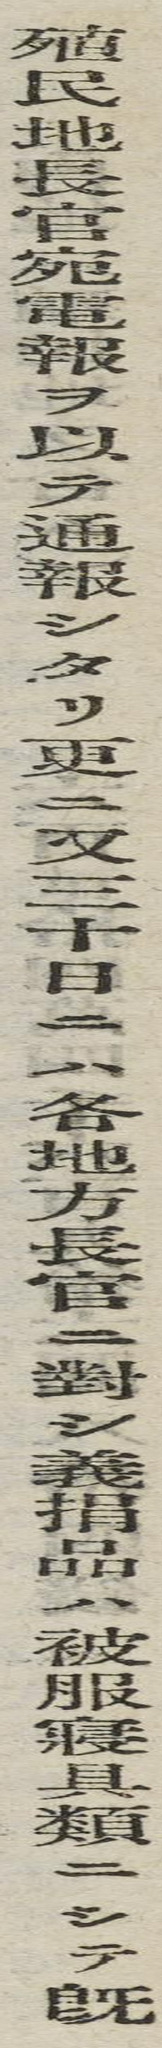殖民地長官宛電報ヲ以テ通報シタリ更ニ又三十日ニハ各地方長官ニ対シ義捐品ハ被服寝具類ニシテ既
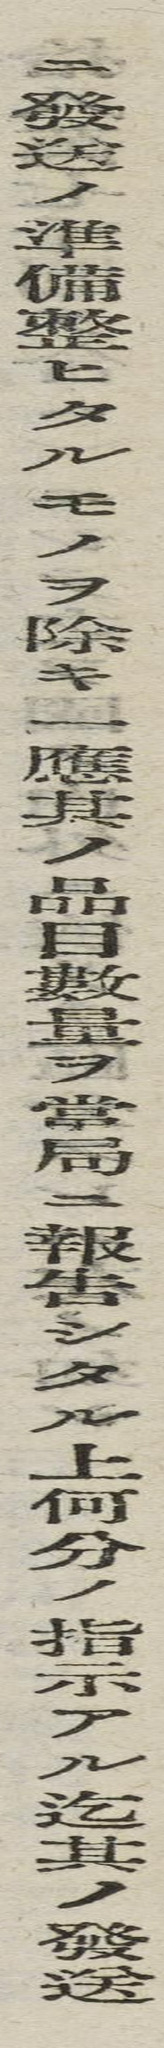ニ発送ノ準備整ヒタルモノヲ除キ一応其ノ品目数量ヲ当局ニ報告シタル上何分ノ指示アル迄其ノ発送
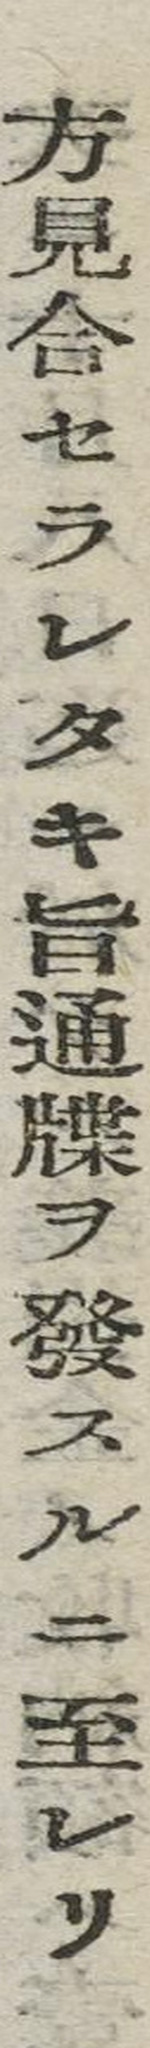方見合セラレタキ旨通牒ヲ発スルニ至レリ
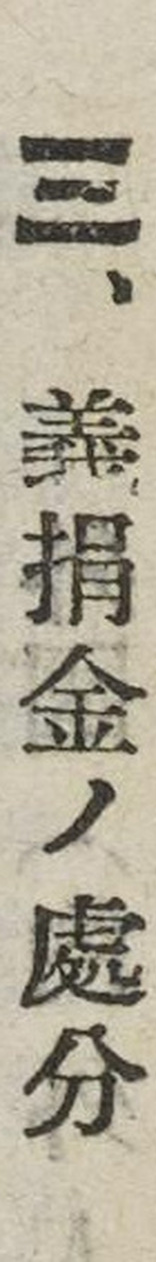三、義捐金ノ処分
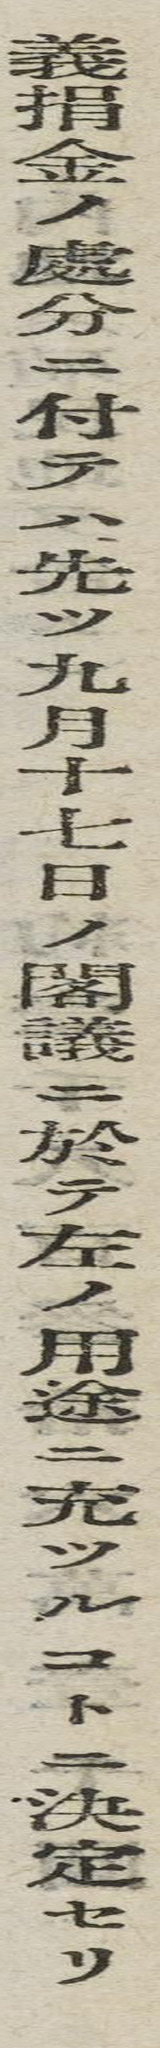義捐金ノ処分ニ付テハ先ツ九月十七日ノ閣議ニ於テ左ノ用途ニ充ツルコトニ決定セリ
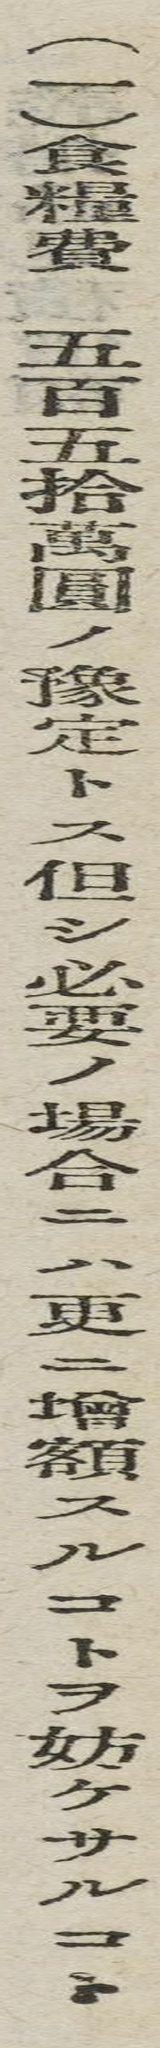食糧費五百五拾万円ノ予定トス但シ必要ノ場合ニハ更ニ増額スルコトヲ妨ケサルコト
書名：震災被害状況並救護施設概要
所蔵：東京大学地震研究所図書室 Earthquake Research Institute Library, The University of Tokyo, JAPAN
